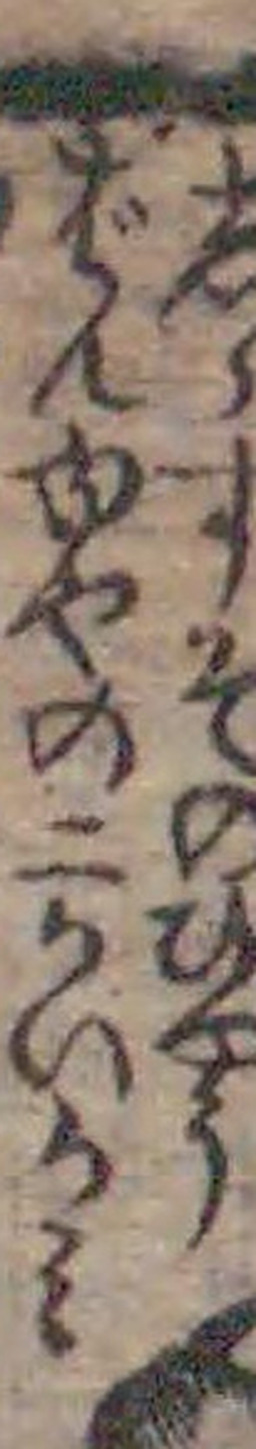ばんゆやの二かいかみ
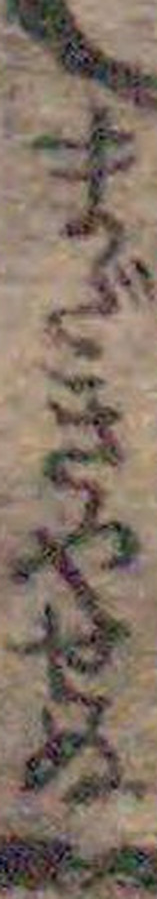まだきやせぬ
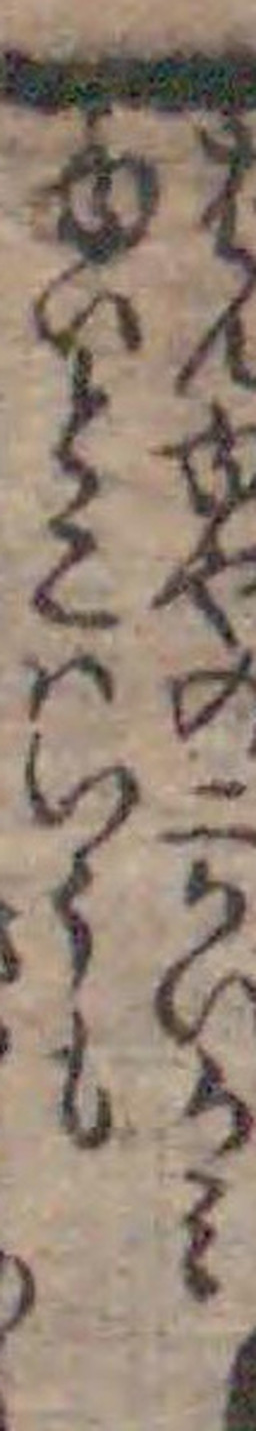ゆいとこはいうも

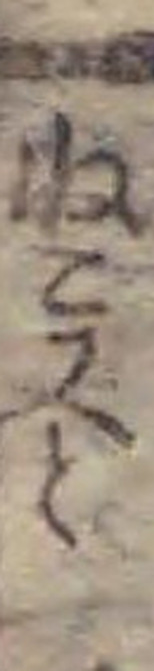ねこ又と
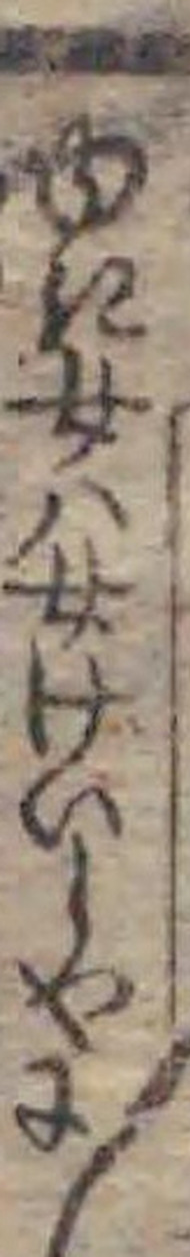ゆき女は女げいしやに
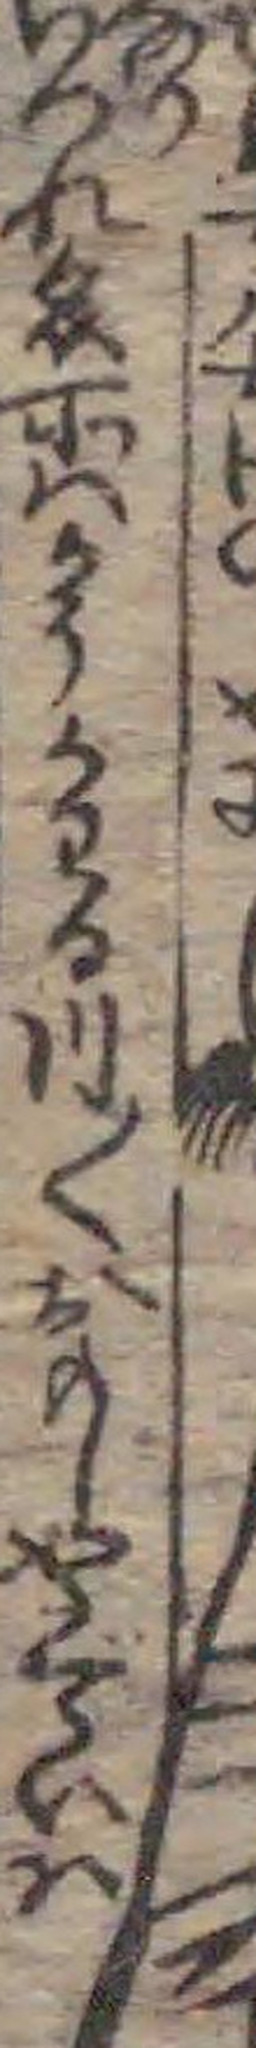いつれ名所はかうかわる川〳〵おもしやぐらいは
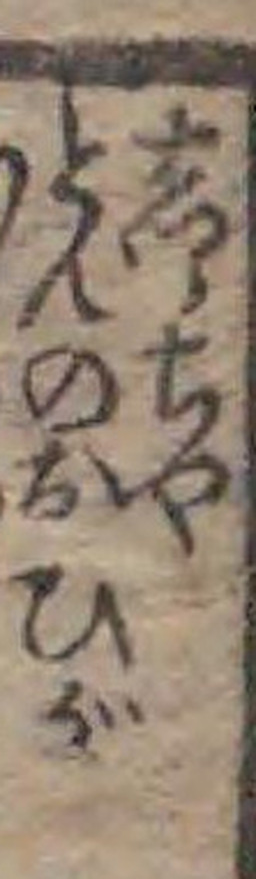とんのおひが
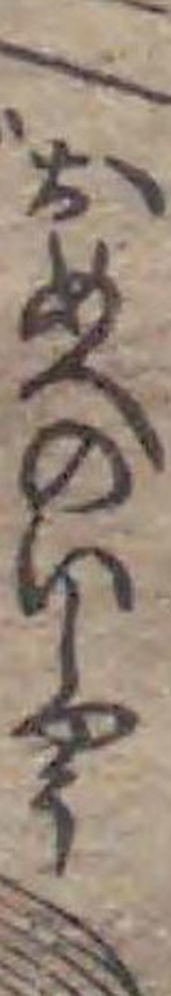おめへのいしやう
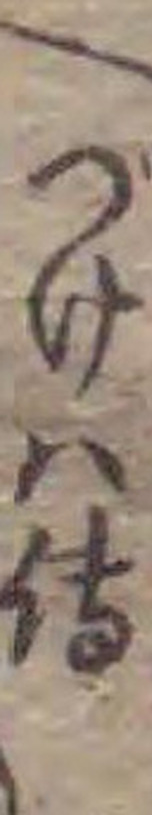づけは伝
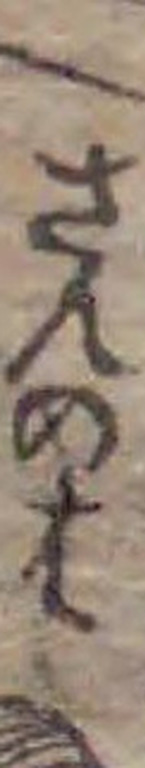さんのは
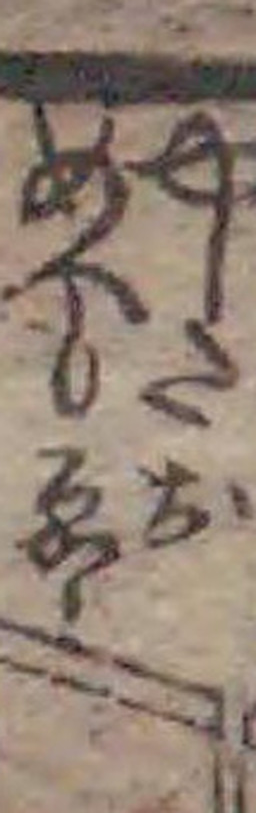めへもゑゝ
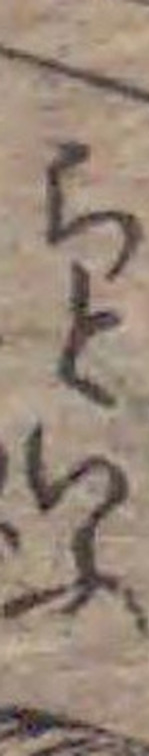らといふ
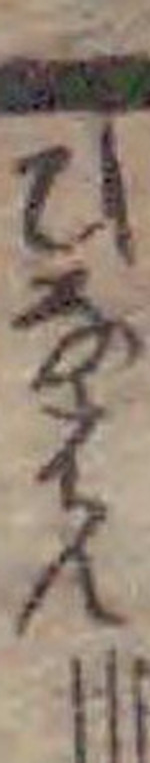ひなはん
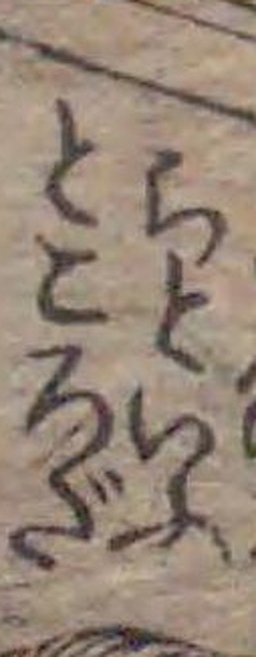ところだ
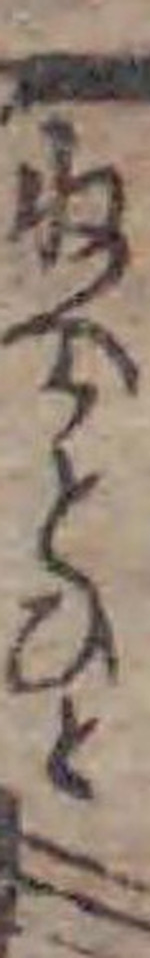ねへかとひと
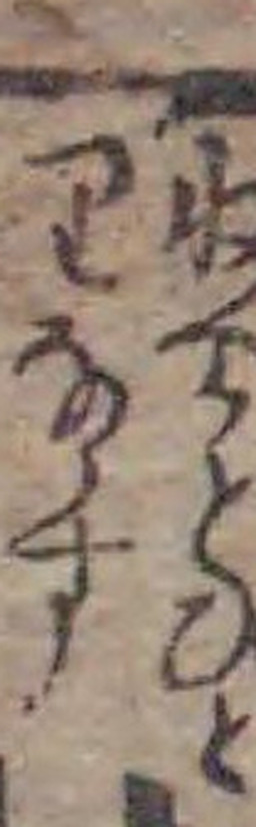りならす
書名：化物楽屋異牒 : 2巻
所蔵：国立国会図書館 National Diet Library, JAPAN
